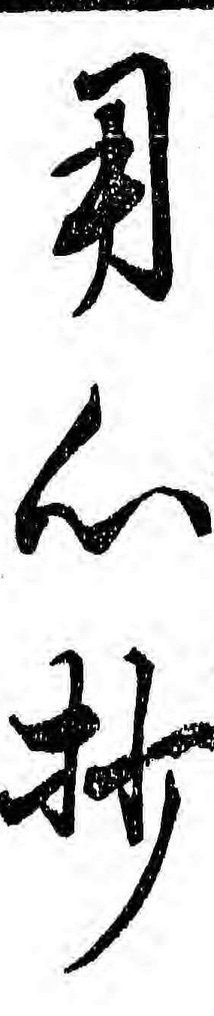用心抄
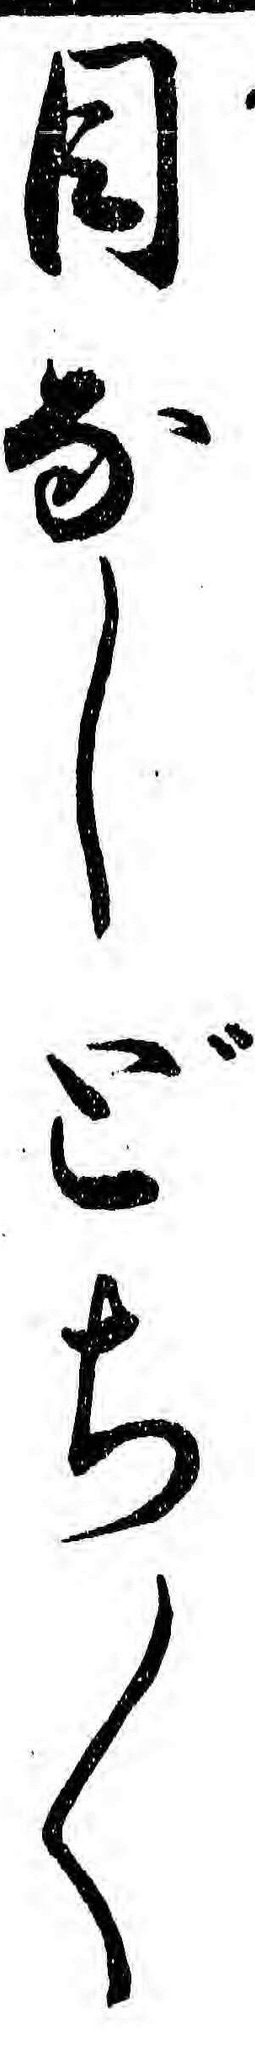目なしどち〳〵
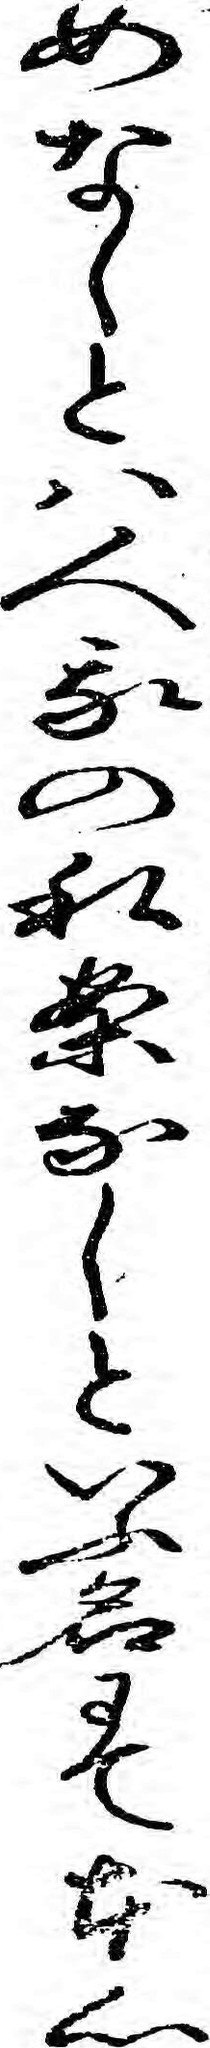めなしとは人我の私案なしといふ名にて本心
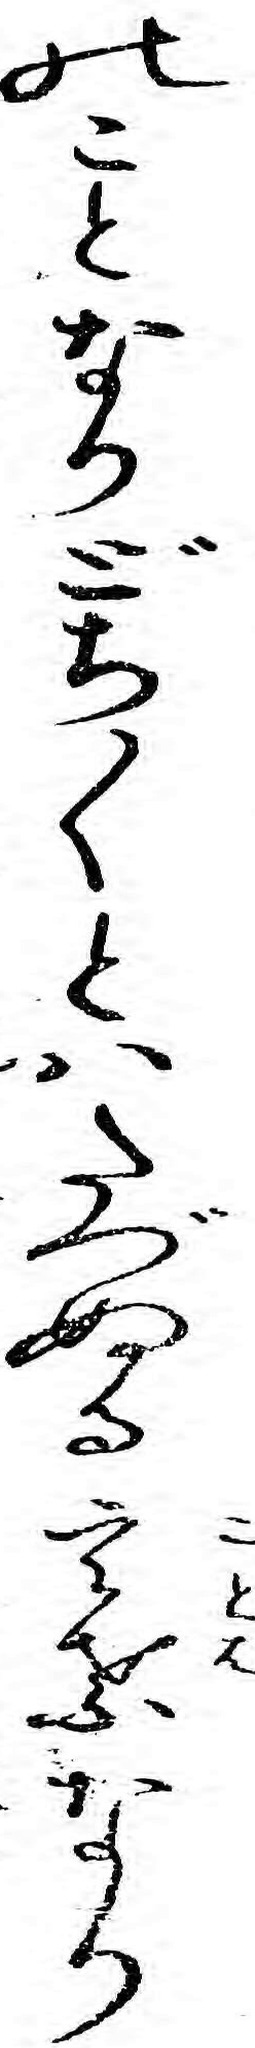のことなりどち〳〵とはたづぬる言葉なり
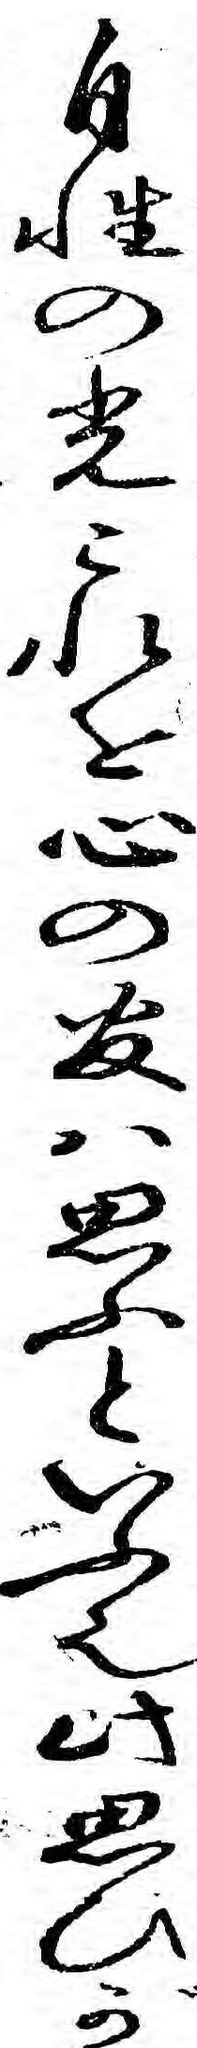自性の光これを心の官は思ふといふ也此思ひが
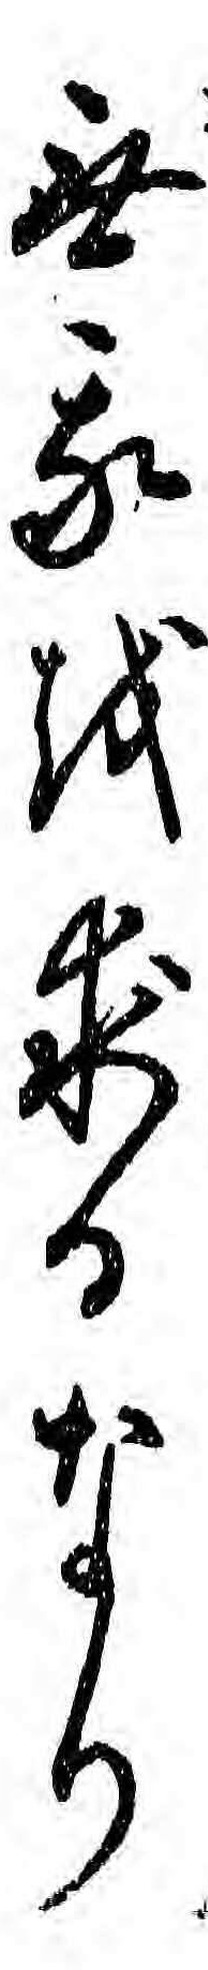無我を求るなり
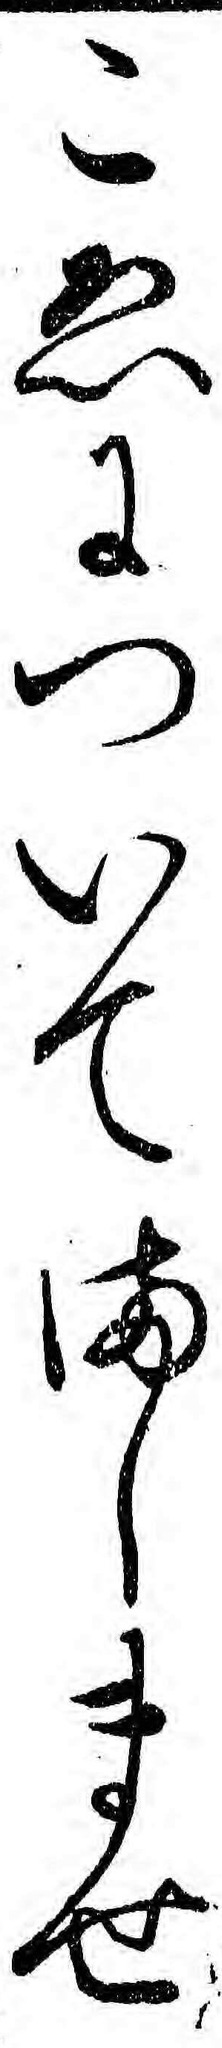こゑについてましませ
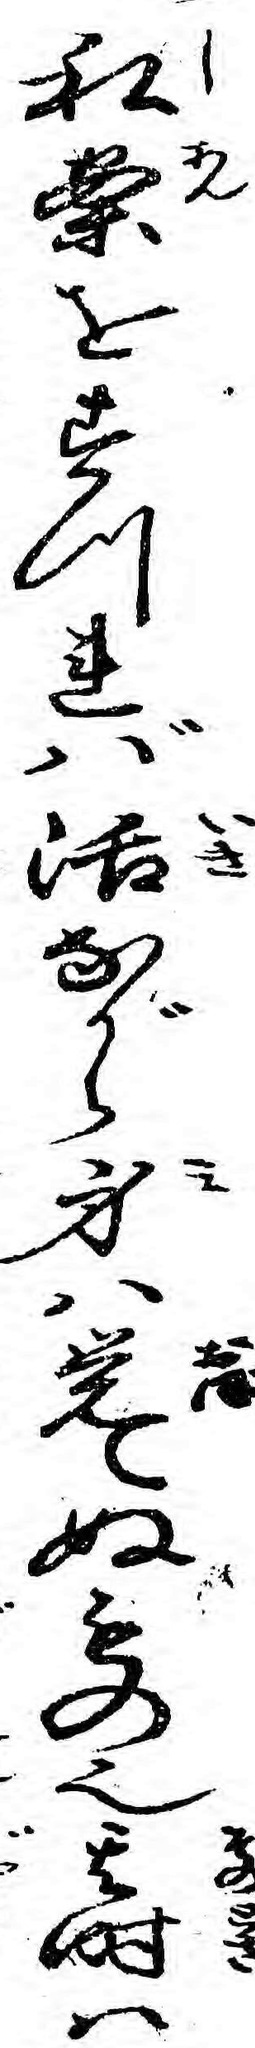思案をすつれば活ながら身は覚えぬもの也其時は
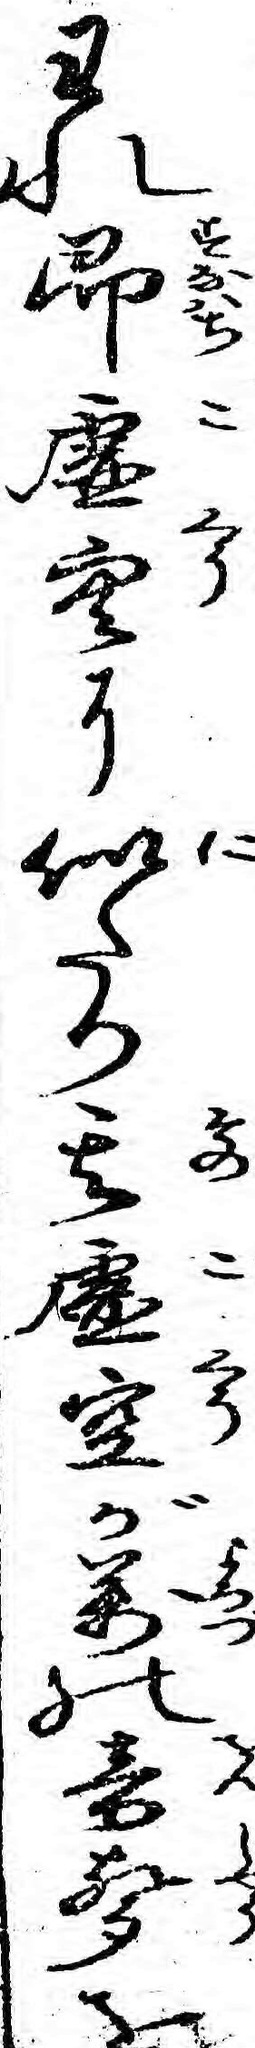われ即虚空に似たり其虚空が万の音声を

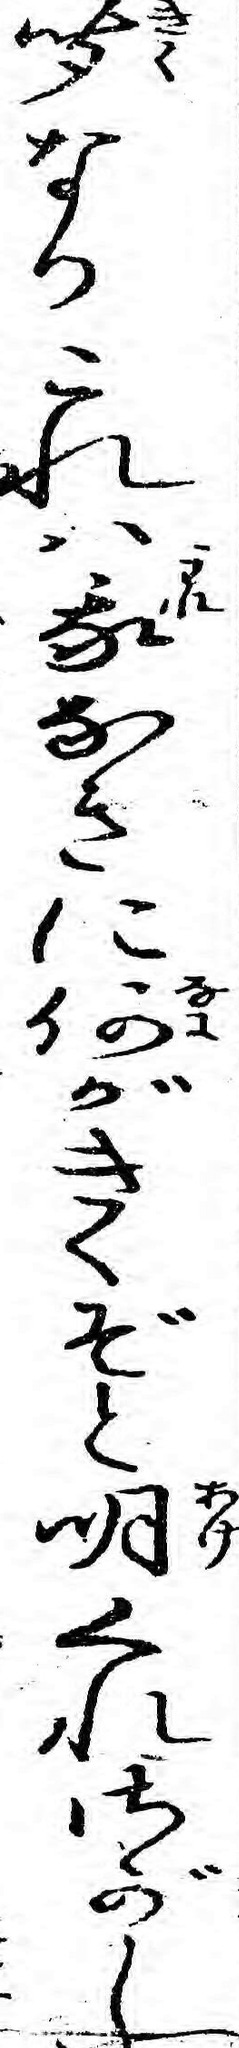聞なりこれは我なきに何がきくぞと明くれさがし
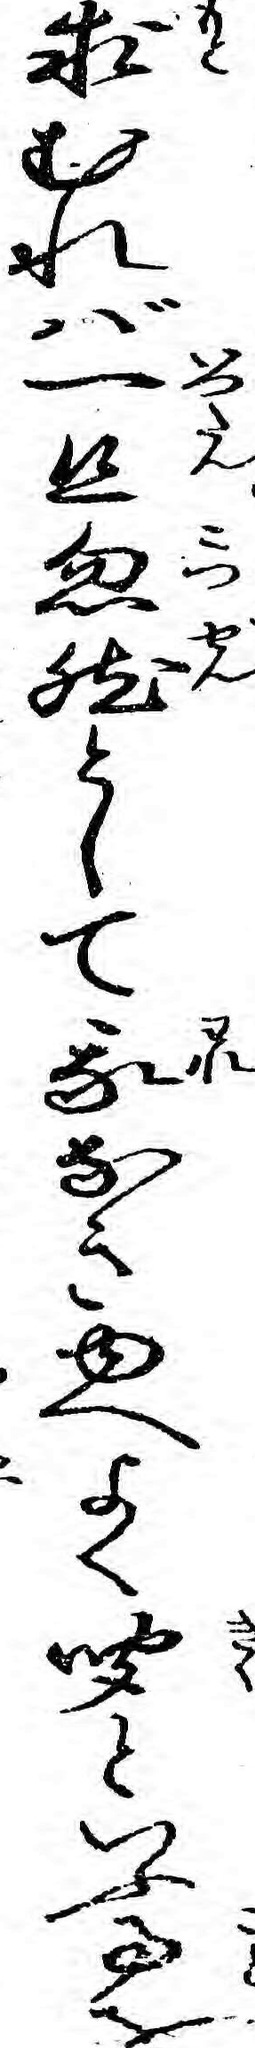求むれば一旦忽然として我なきゆへよく聞といふ事を
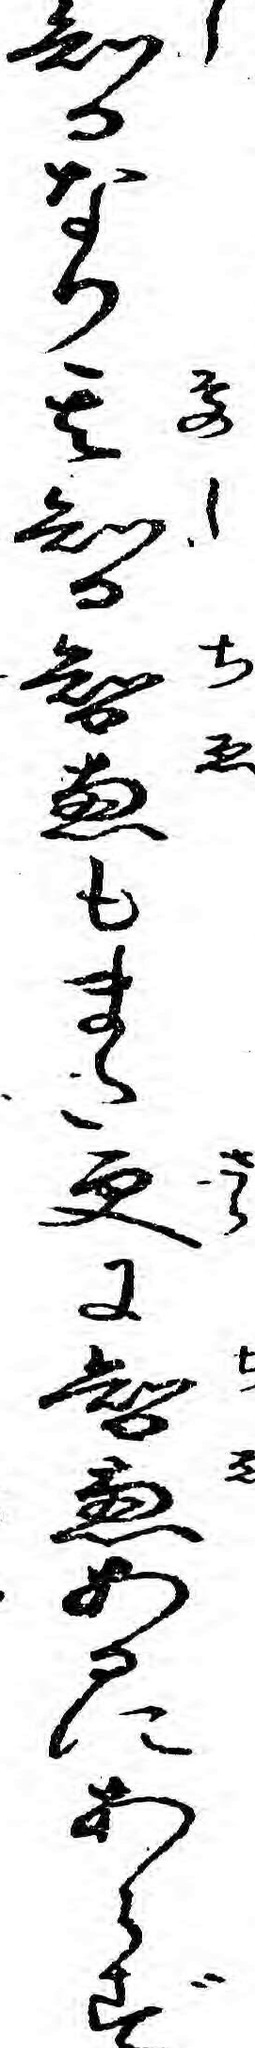知るなり其知る智恵もまた更に知恵あるにあらず
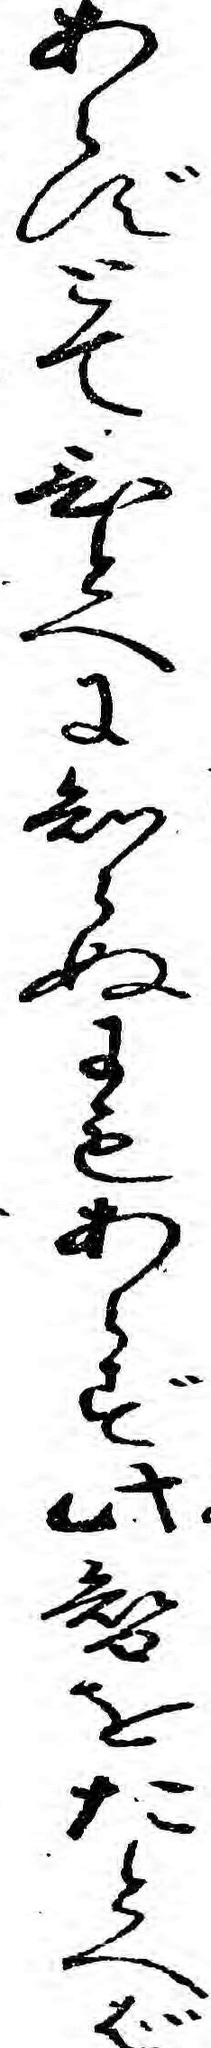あらずとてひとへに知らぬにもあらず此智をたとへば
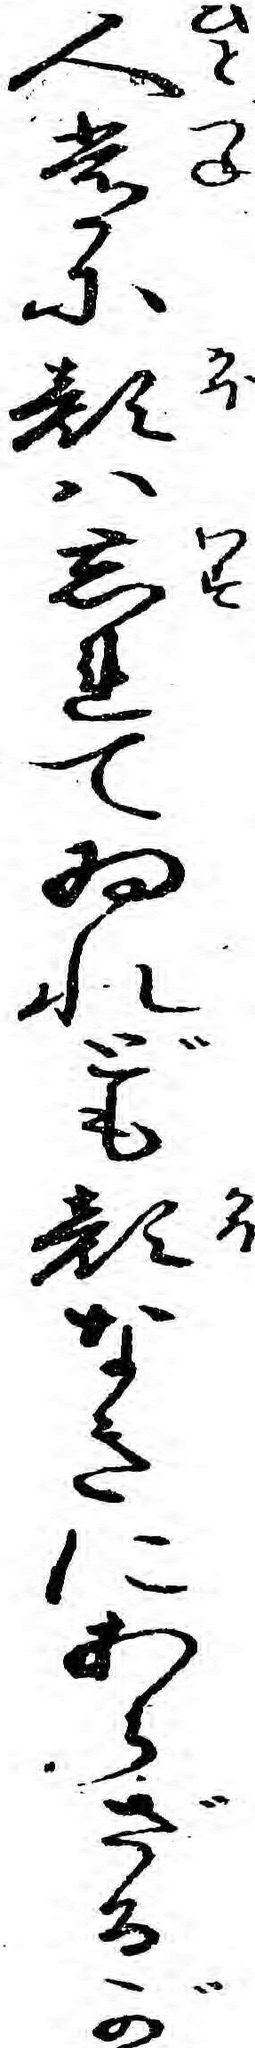人常に顔は忘れてゐれども顔なきにあらざるが
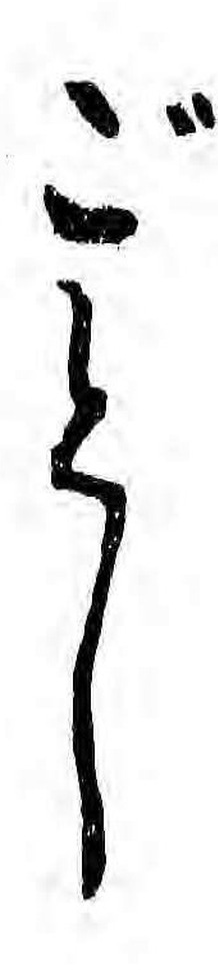ごとし
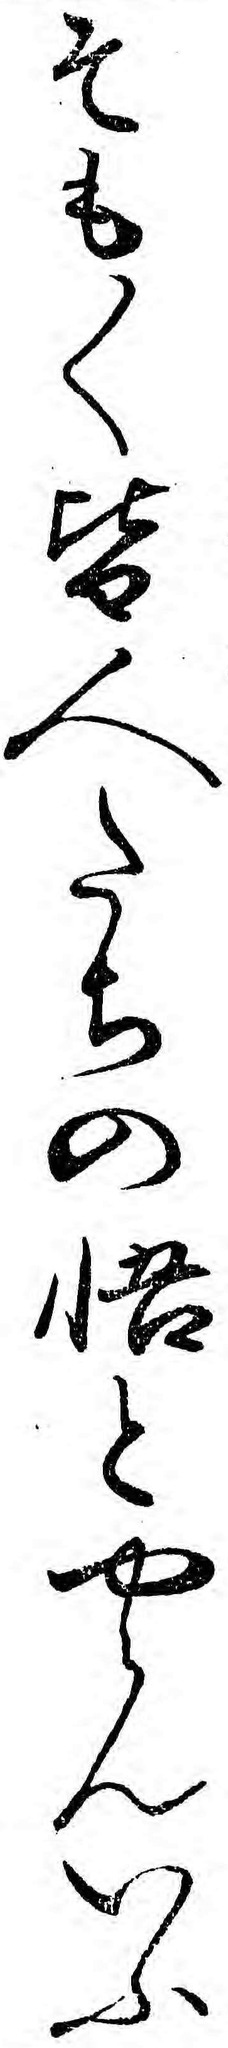そも〳〵皆人たちの悟とやらんいふ
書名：目なし用心抄
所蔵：国文学研究資料館
